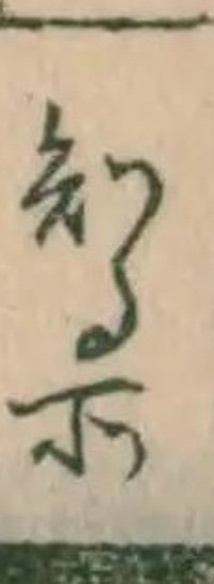知る所
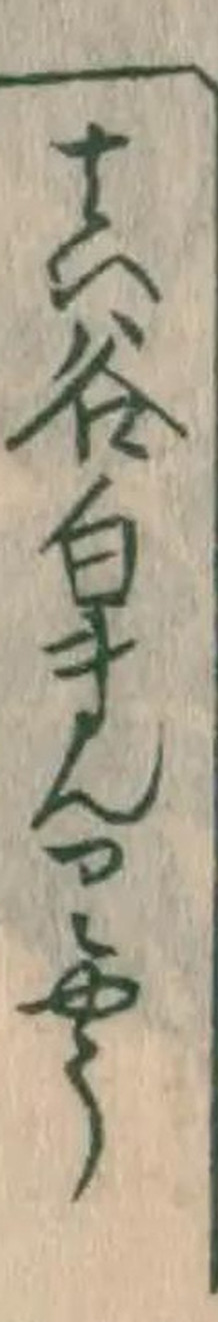真谷白まんりやう
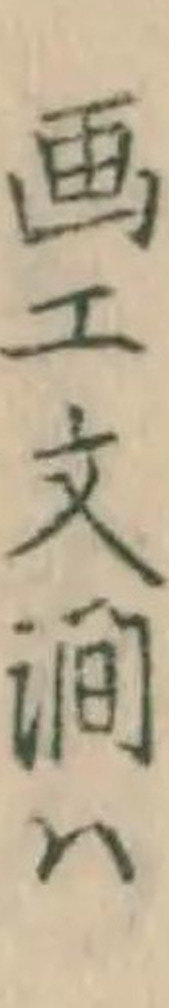画工文澗は
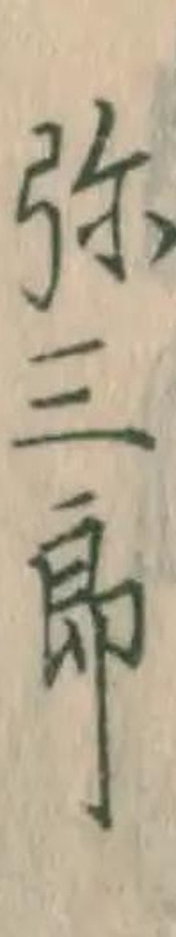弥三郎

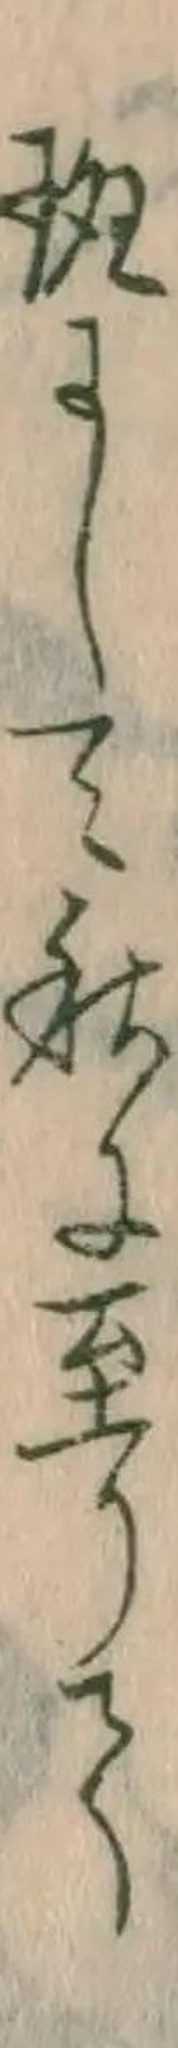斑にして秋に至りて
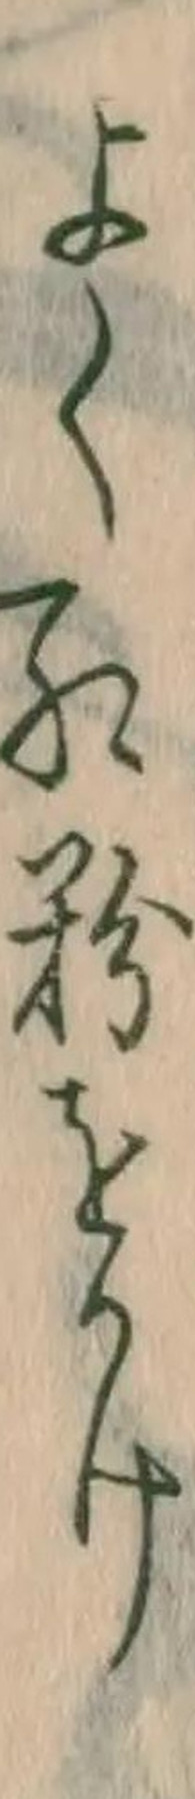よく紅粉をかけ
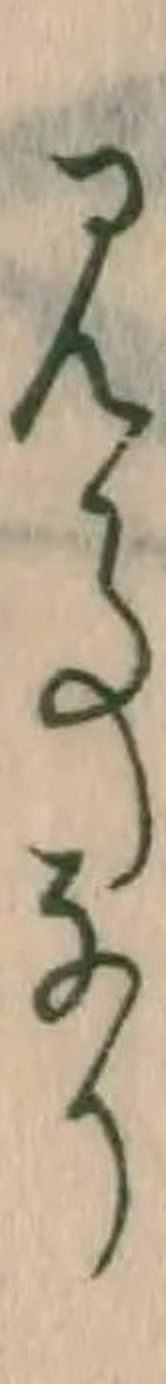見事なり
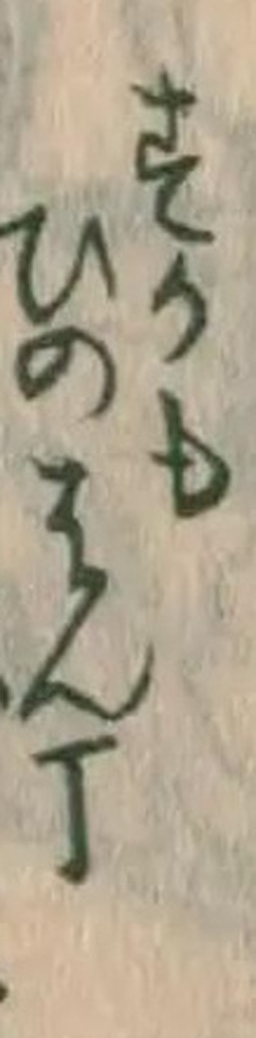ひのはん丁
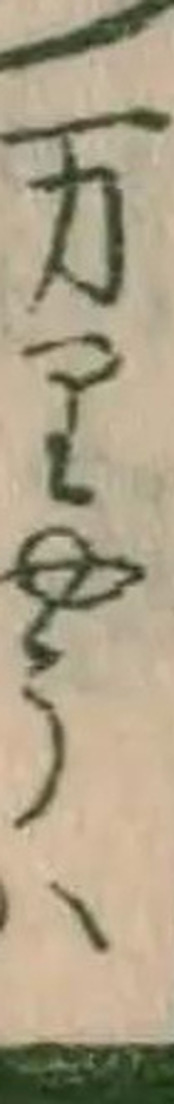万りやうは
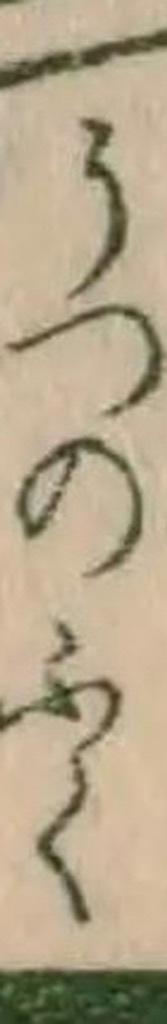うつのふく
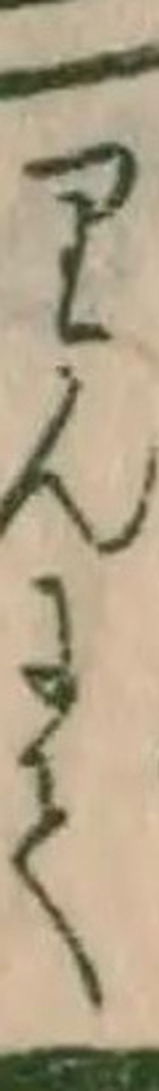りんにて
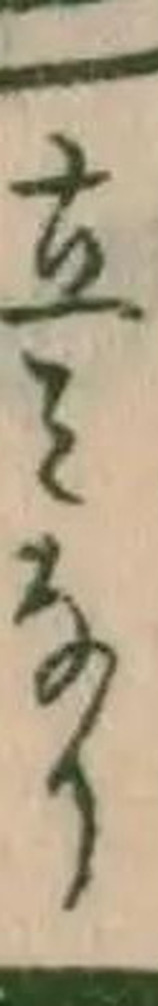立みなり
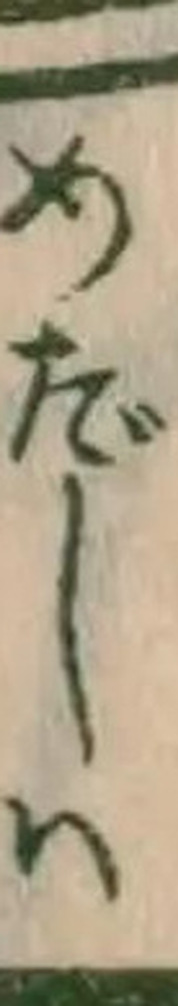めだしは
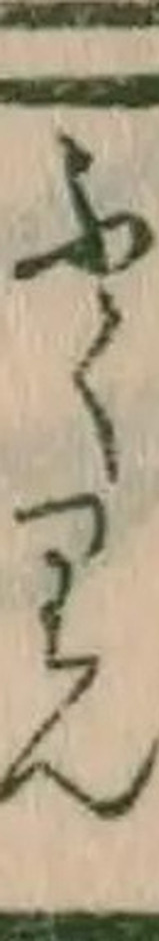ふくりん
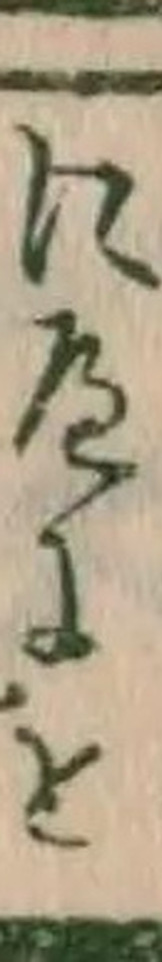にへにを
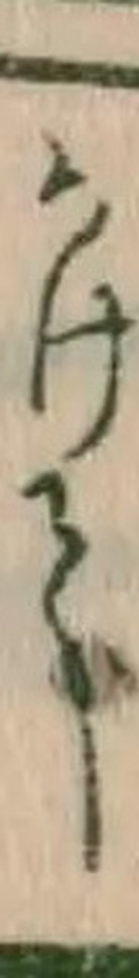かけて
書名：草木奇品家雅見 3巻. [3]
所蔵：国立国会図書館 National Diet Library, JAPAN
